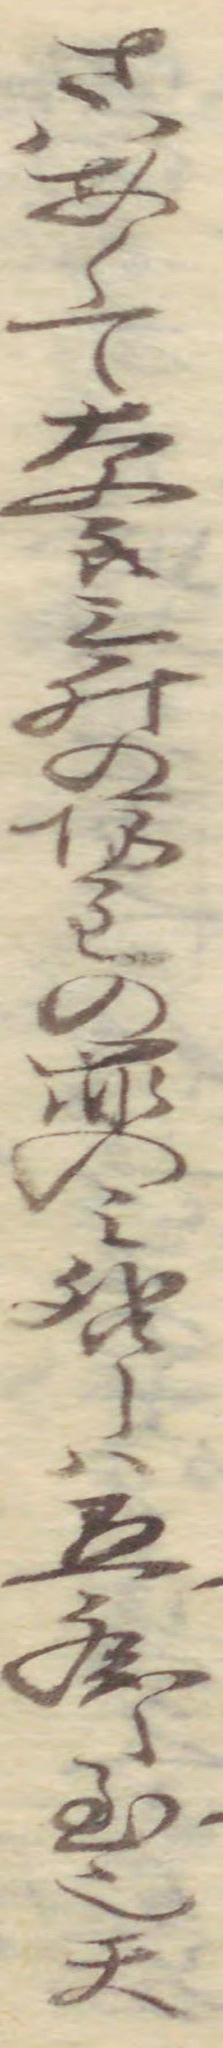さはなくて奈良三井の坊主の罪のみ咎しは愚痴之至也天
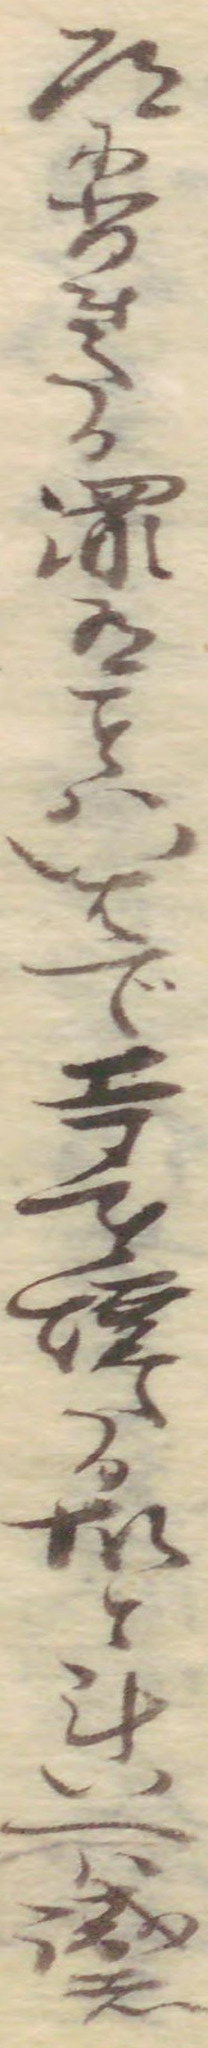道に省きたる罪有ことはいはで寺を焼たる故と計いへは識者
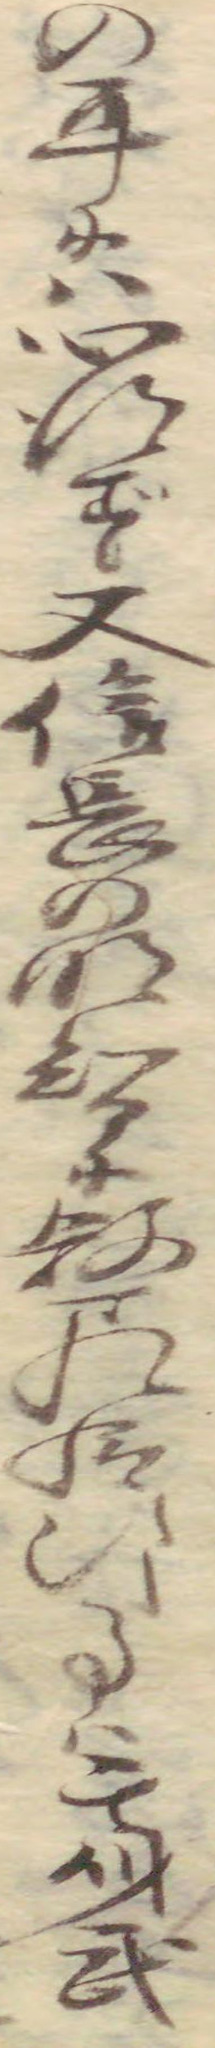の耳には心得ず又信長の明智に殺され給ひし事は其身武
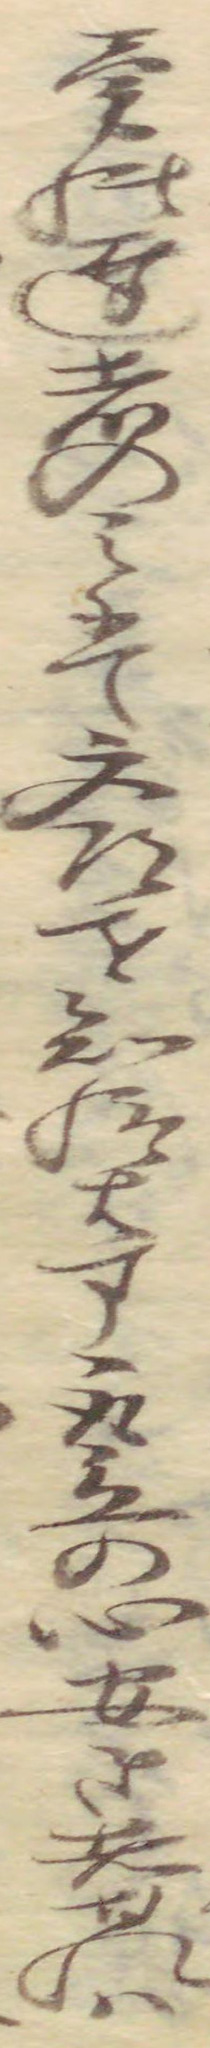勇の達者のみにて文道を知給はす取立の心安き者なれは
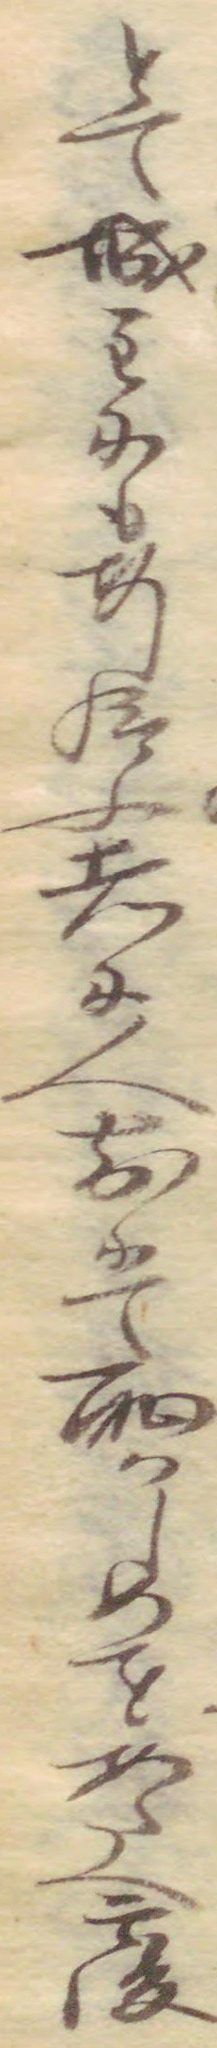とて城主にもなし給ふ者に人前にて恥かしめをあたへ其後

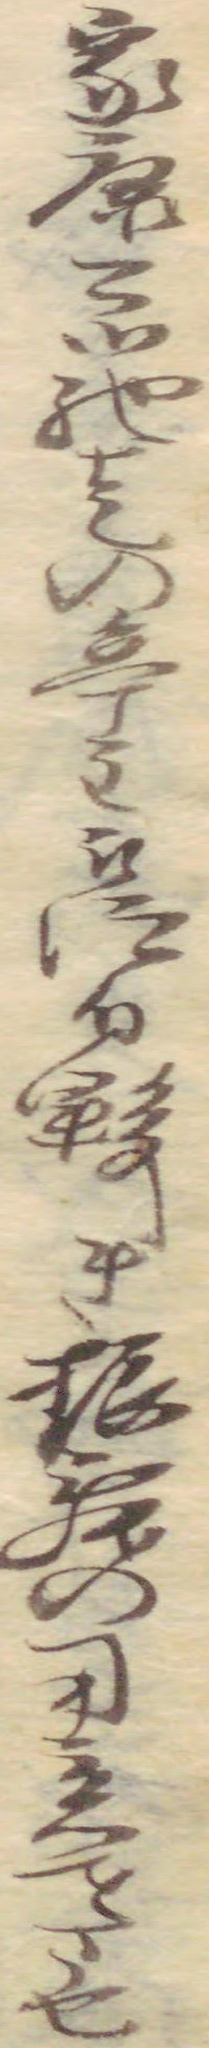家康公御馳走の亭主被仰付夥しき振舞の用意をさせ
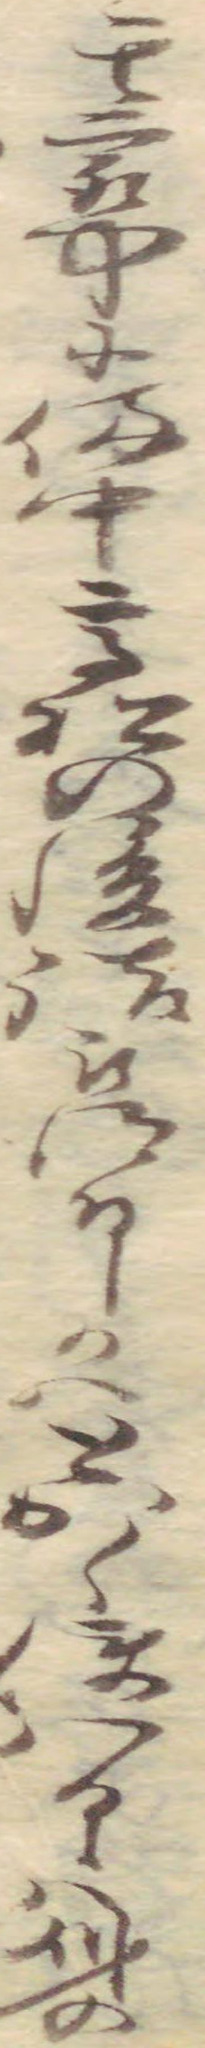其最中に備中高松の後詰被仰付しかはとかく使はるゝは身の
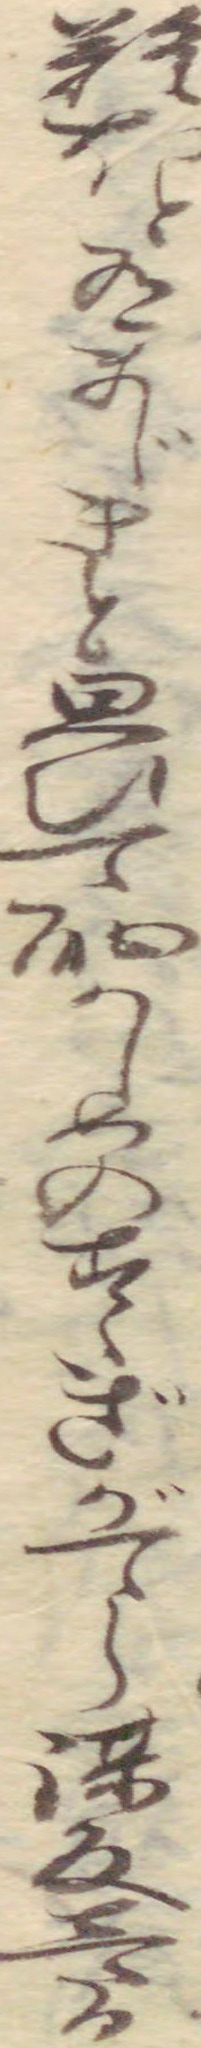難ほと有まじきと思ひて恥かしめのすゝぎがてら謀反したる
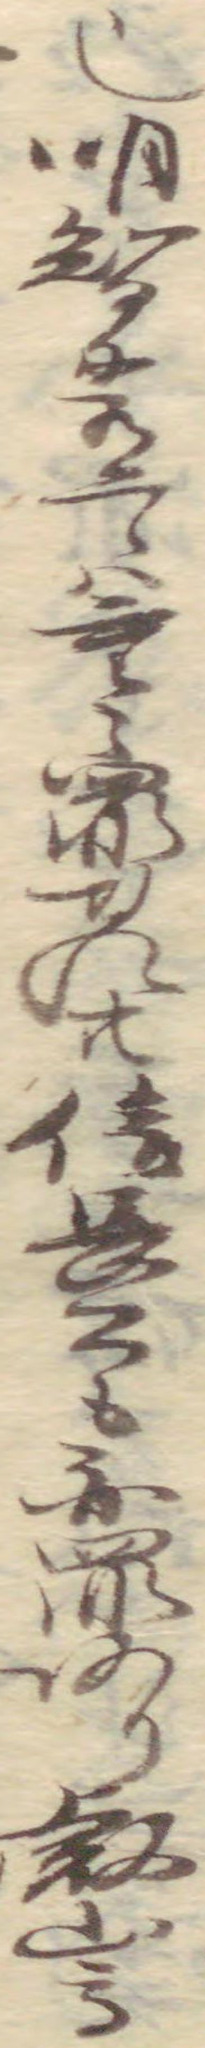也明智に有ては重〻罪なれ共信長公も亦罪あり叡山高
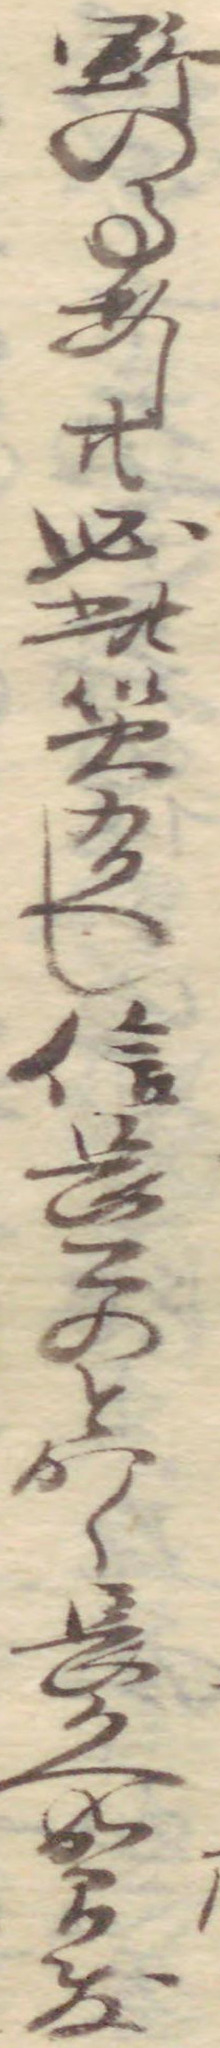野の事なし共必此の災有へし信長公のとかく長久成間敷
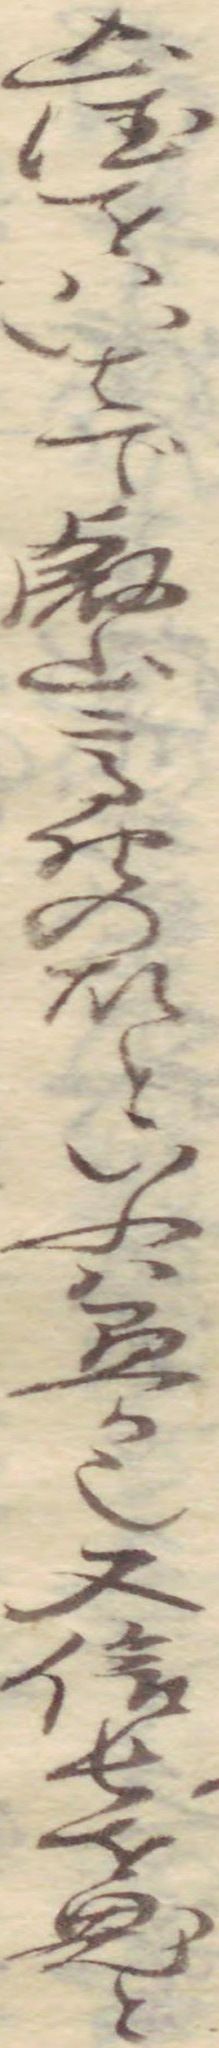凶徳をはいはで叡山高野の故といふは愚か也又信長を鬼と
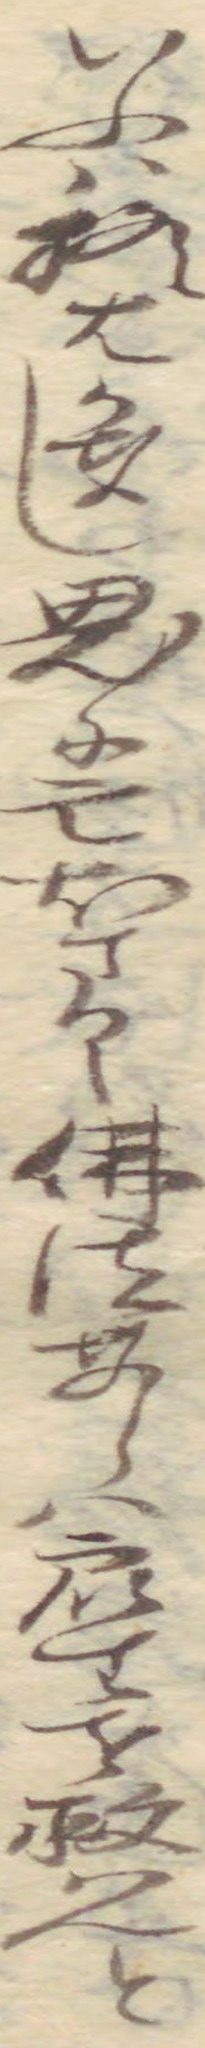いふは猶はかなし鬼に亡さるゝ仏法ならは衆生を救はんと
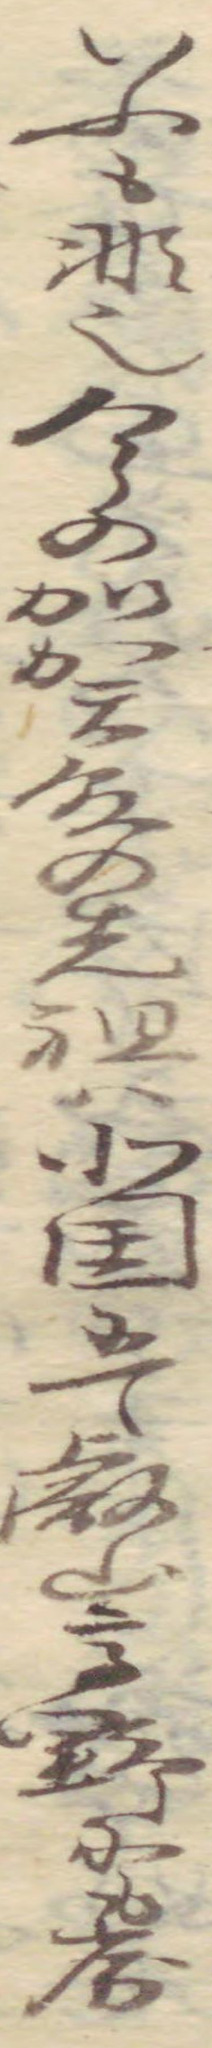いふも非之今の加賀殿の先祖は北国にて叡山高野にも劣
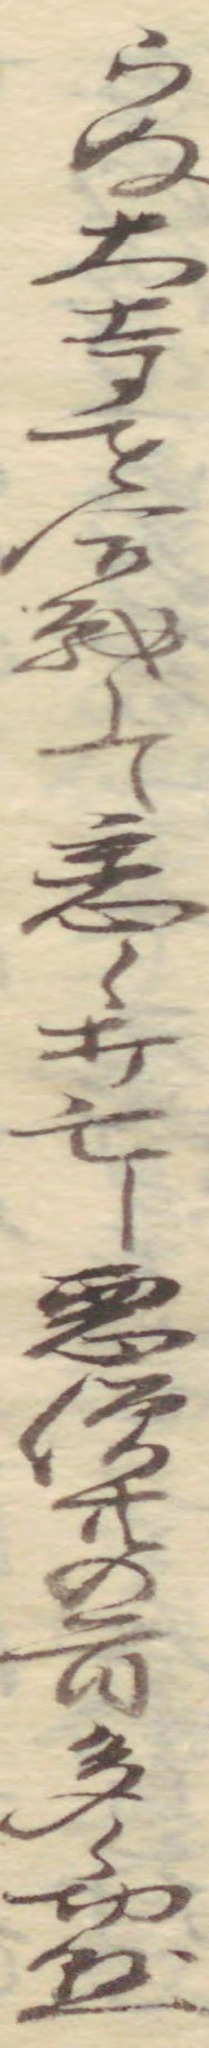らぬ大寺を合戦して悉く打亡し悪僧共の首多く切懸
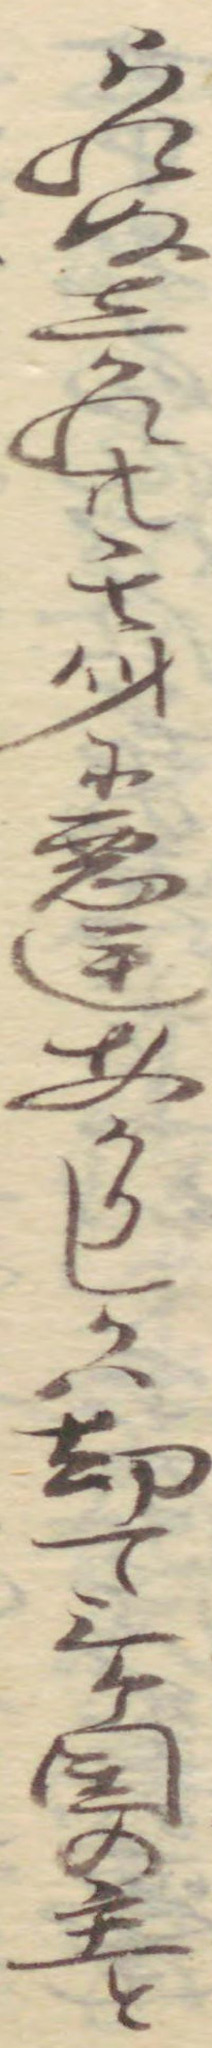られぬしかれ共其身に悪逆なかりしかは却て三ケ国の主と
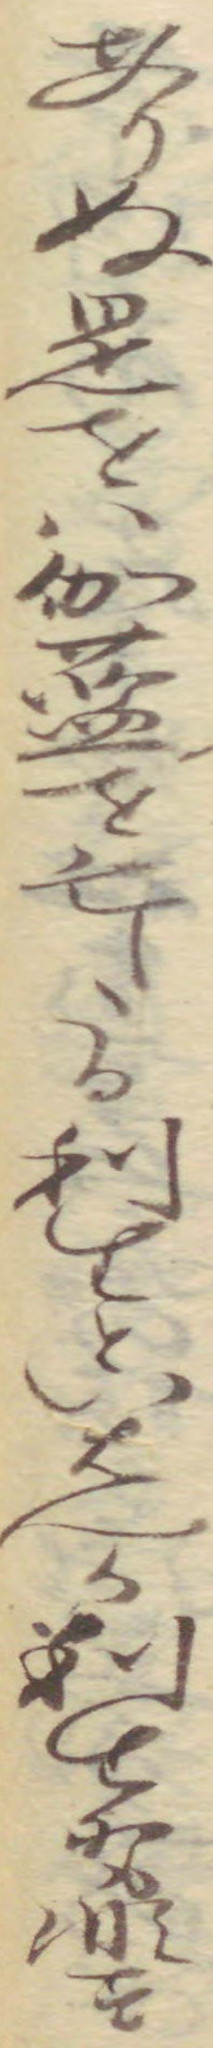なりぬ是をは伽藍を亡したる利生といはんか利生にも非す
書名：鶯宿雑記. 巻263-264
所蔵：国立国会図書館 National Diet Library, JAPAN
